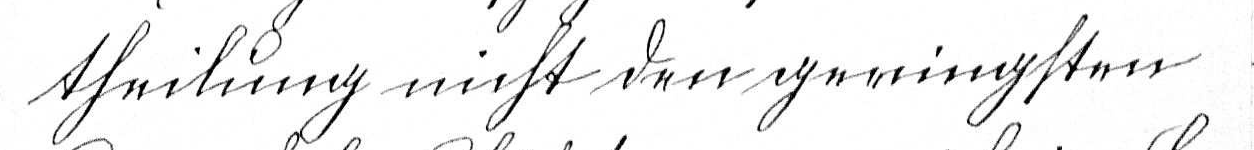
theilung nicht den geringsten
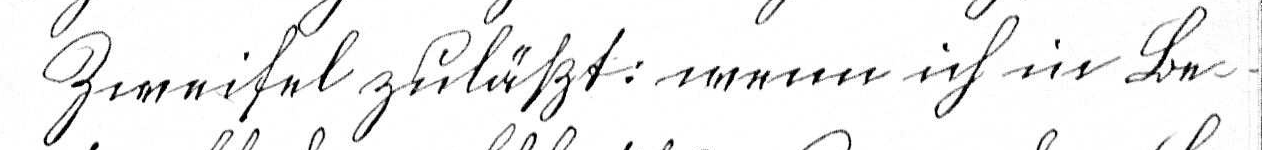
Zweifel zuläßt: wenn ich in Be¬
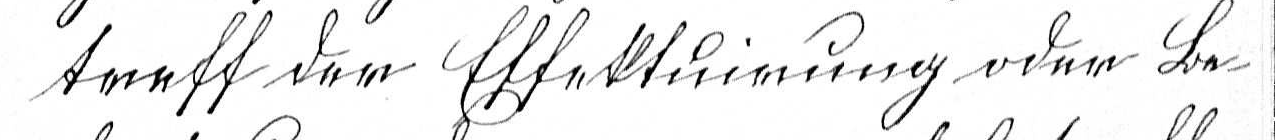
treff der Effektuirung oder Be¬
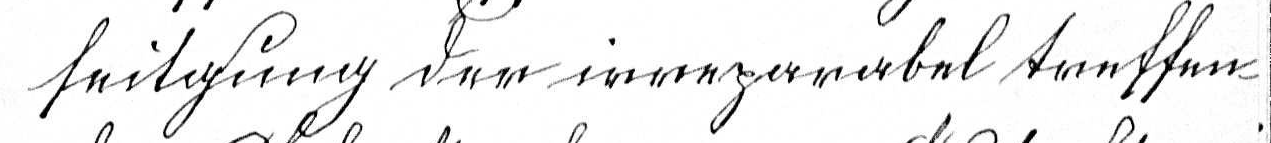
seitigung der irreparabel treffen¬
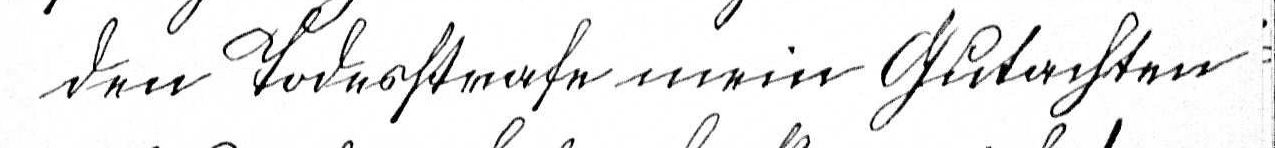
den Todesstrafe mein Gutachten
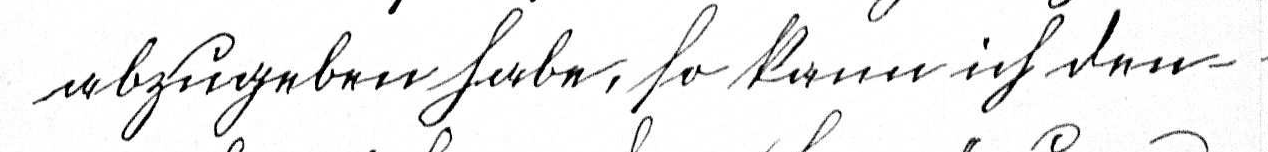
abzugeben habe, so kann ich den¬
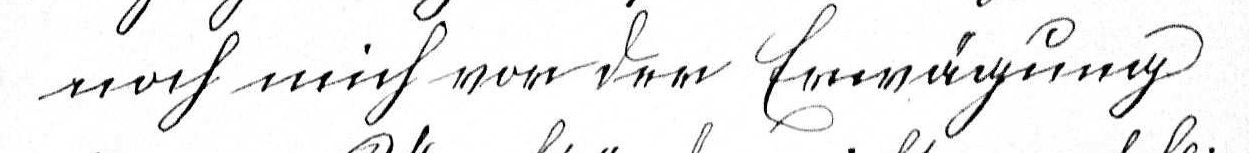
noch mich vor der Erwägung
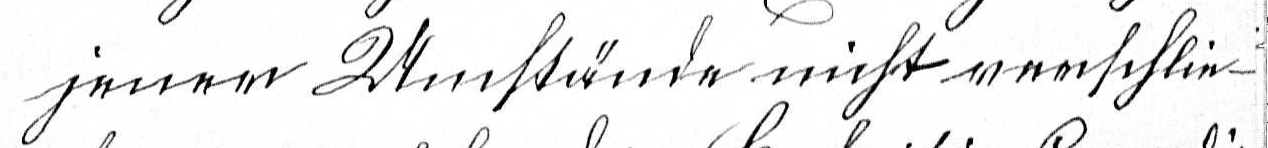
jener Umstände nicht verschlie¬
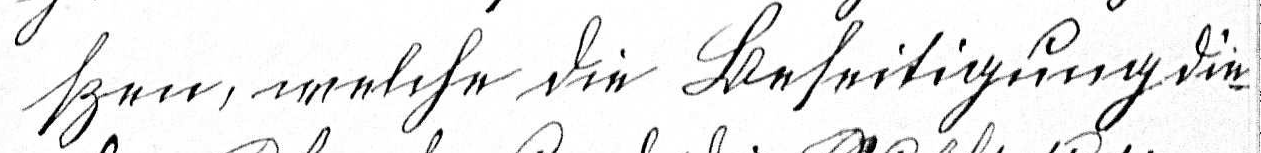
ßen, welche die Beseitigung die¬
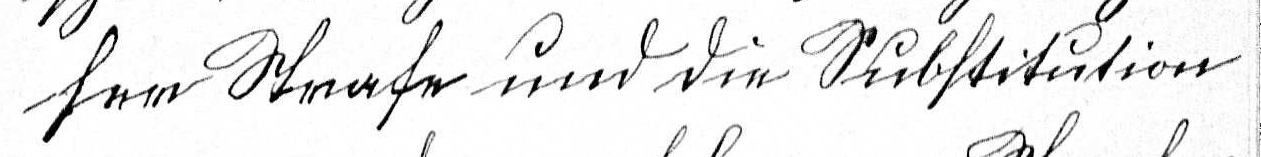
ser Strafe und die Substitution
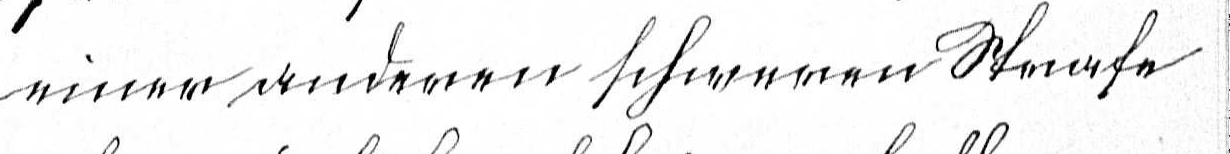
einer anderen schweren Strafe
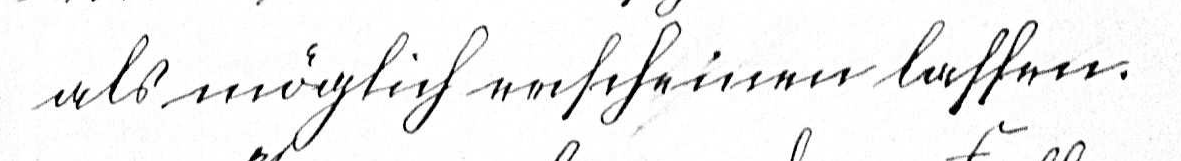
als möglich erscheinen lassen.
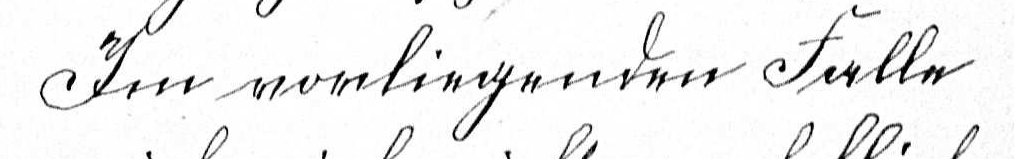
Im vorliegenden Falle
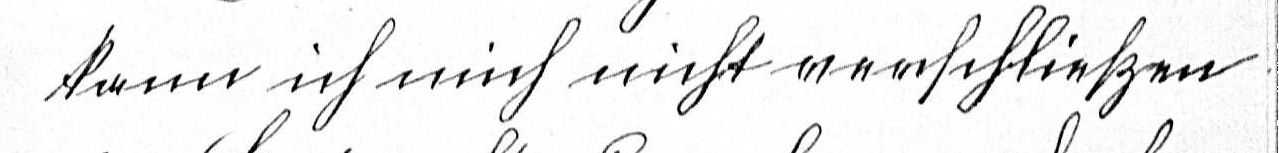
kann ich mich nicht verschließen
